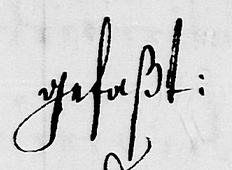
gefaßt:
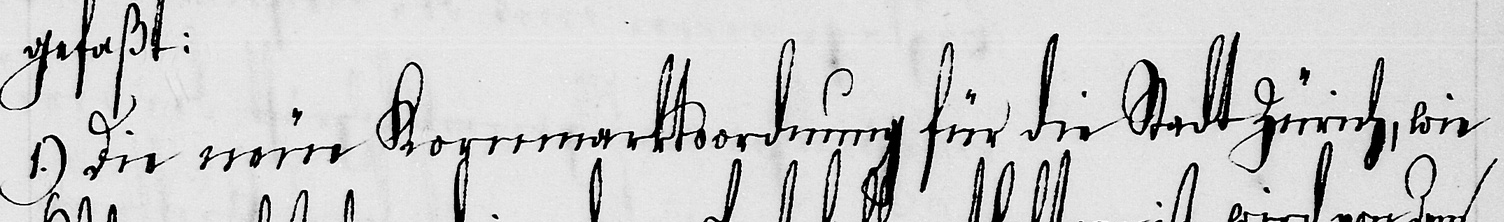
1.) Die neue Kornmarktsordnung für die Stadt Zürich, wie
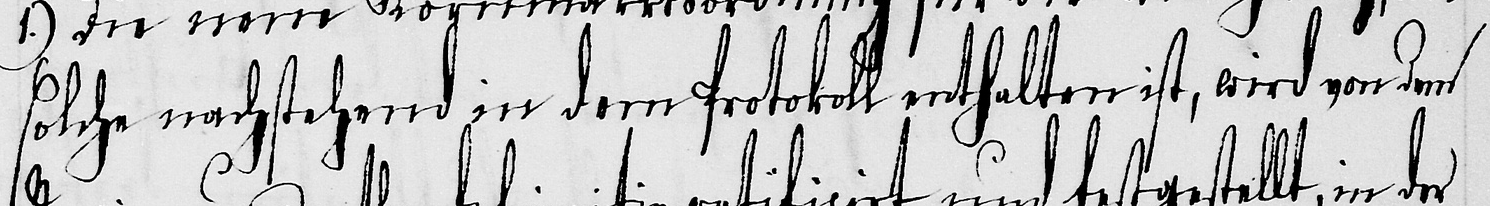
solche nachstehend in dem Protokoll enthalten ist, wird von
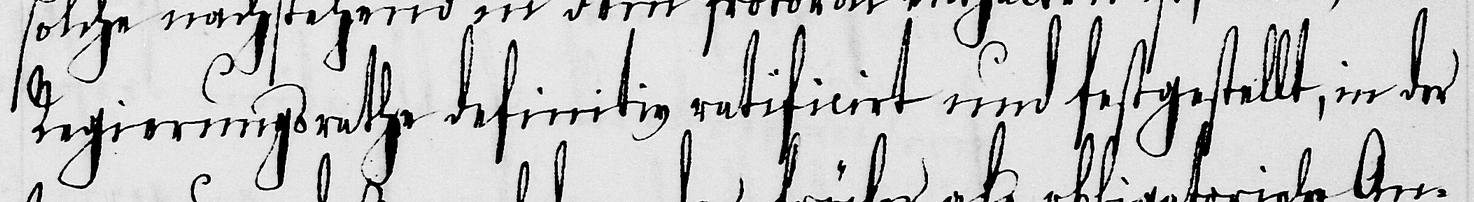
Regierungsrathe definitiv ratificirt und festgestellt,
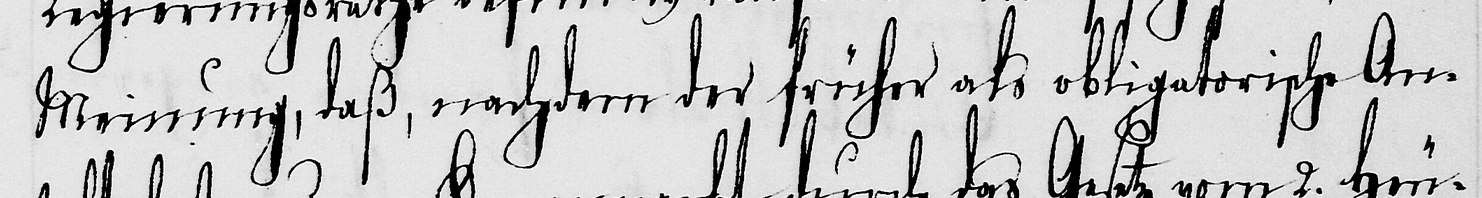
Meinung, daß, nachdem der früher als obligatorische Ans¬
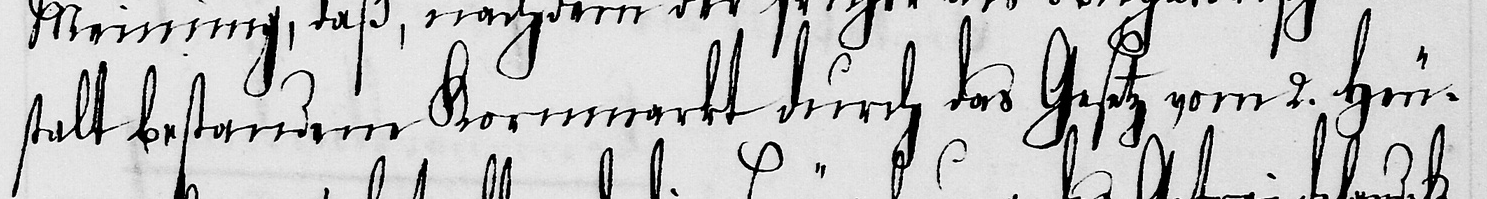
talt bestandene Kornmarkt durch das Gesetz vom 2. Heu¬
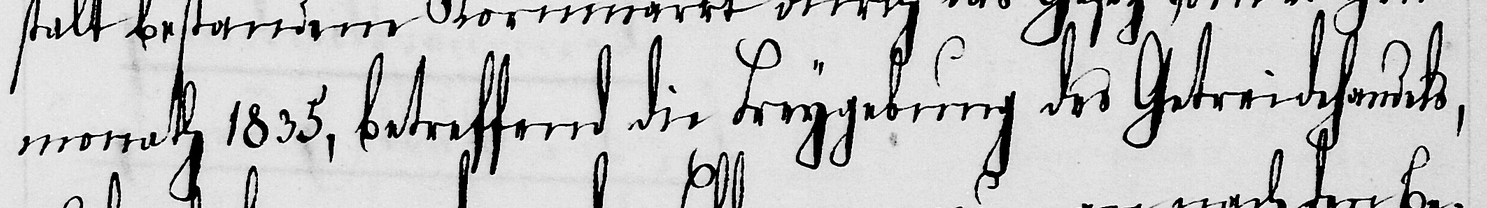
monath 1835, betreffend die Freygebung des Getreidehandel¬
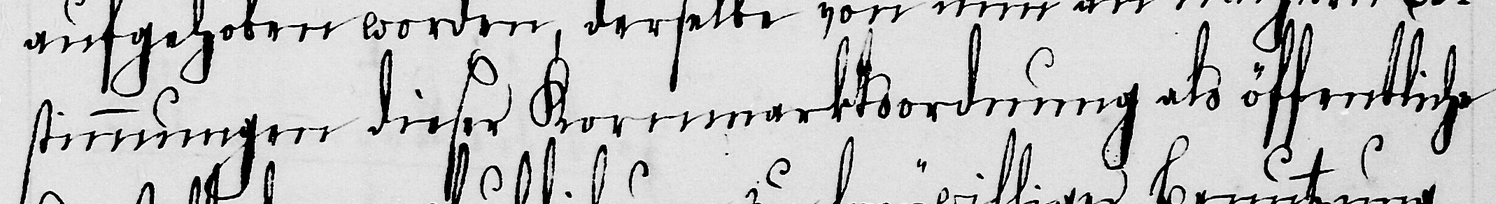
timmungen dieser Kornmarktsordnung als öffentliche
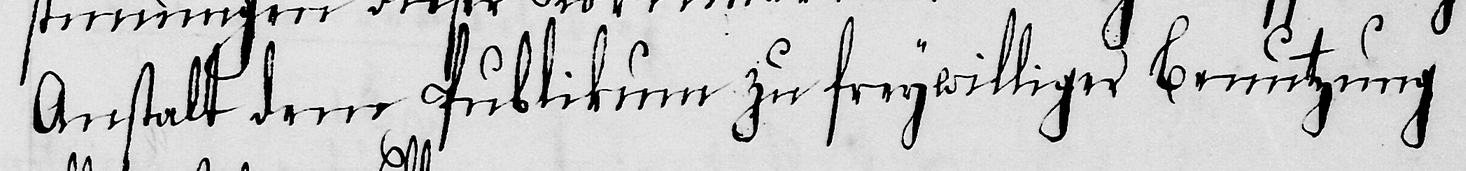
Anstalt dem Publikum zu freywilliger Benutzung
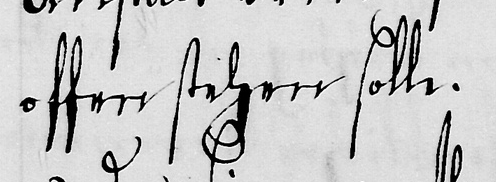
fen stehen sol¬
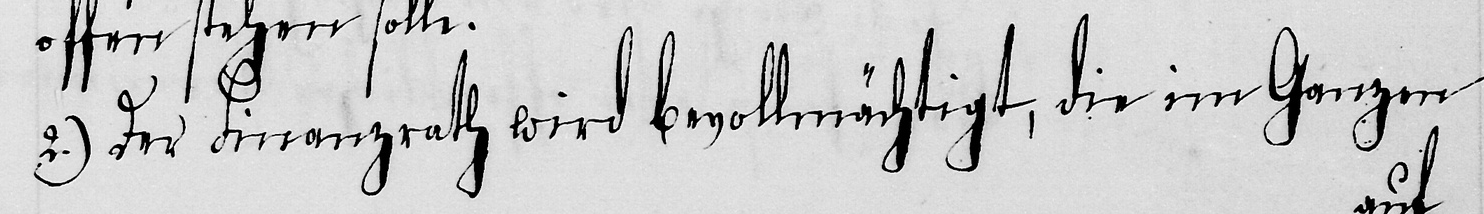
2.) Der Finanzrath wird bevollmächtigt, die im Ganzen
